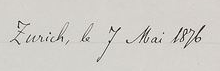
Zurich, le 7 Mai 1876
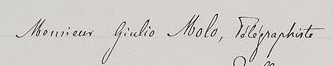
Monsieur Giulio Molo, Télégraphiste
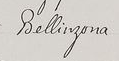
Bellinzona
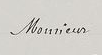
Monsieur
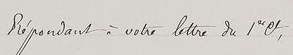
Répondant à votre lettre du 1er Ct,
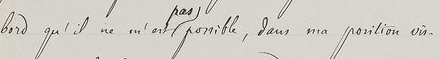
bord qu'il ne m'est pas possible, dans ma position vis-
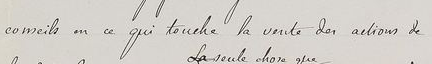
conseils en ce qui touche la vente des actions de
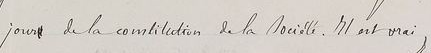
jour de la constitution de la Société. Il est vrai
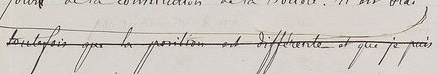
toutefois que la position est differente et que je puis
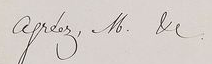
Agréez, M. &c.
